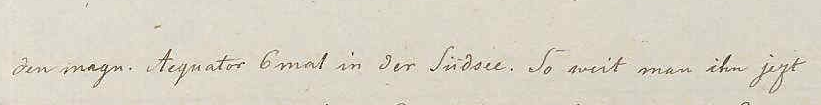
den magn. Aequator 6 mal in der Südsee. So weit man ihn jezt
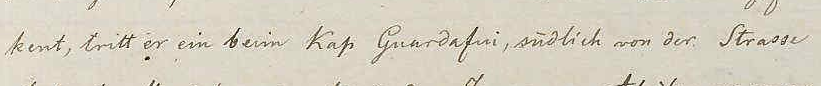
kent, tritt er ein beim Kap Guardafui, südlich von der Strasse
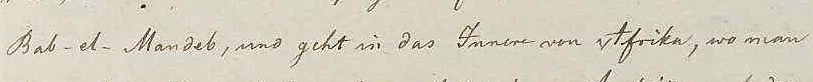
Bab-el-Mandeb, und geht in das Innere von Afrika, wo man
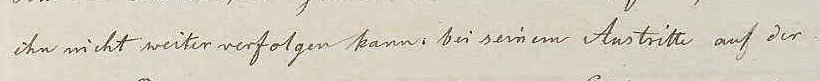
ihn nicht weiter verfolgen kann: bei seinem Austritte auf der
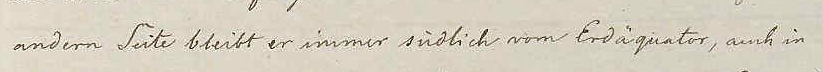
andern Seite bleibt er immer südlich vom Erdäquator, auch in
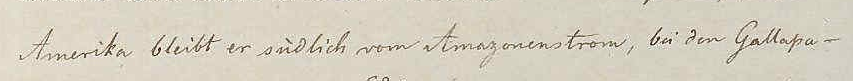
Amerika bleibt er südlich vom Amazonenstrom, bei dem Gallapa-
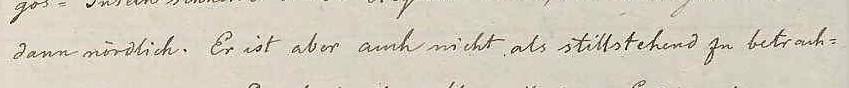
dann nördlich. Er ist aber auch nicht als stillstehend zu betrach-
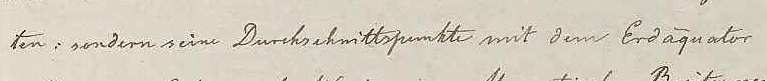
ten: sondern sein Durchschnittspunkte mit dem Erdäquator
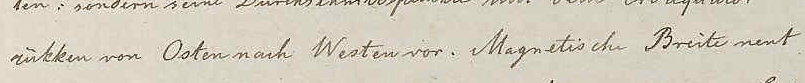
rükken von Osten nach Westen vor. Magnetische Breite nent
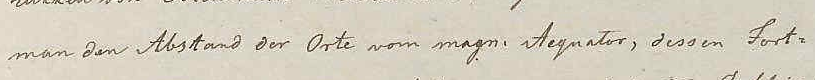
man den Abstand der Orte vom magn. Aequator, dessen Fort-
